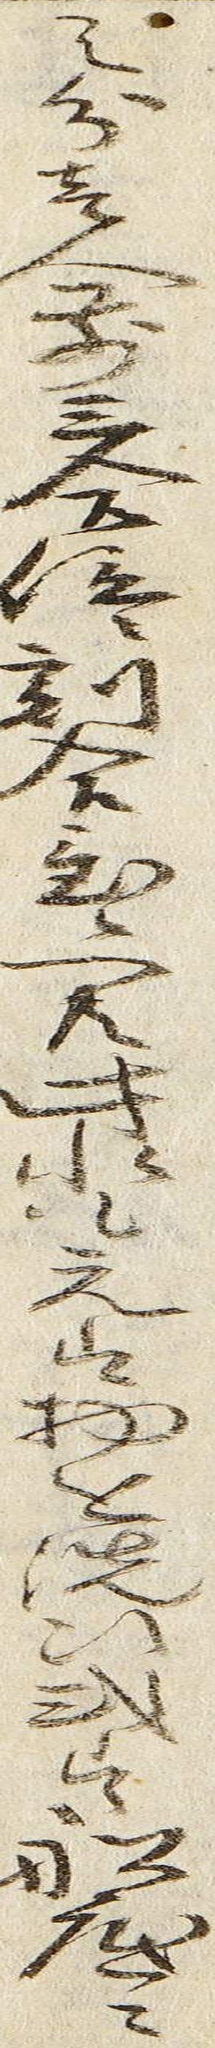之分壱人前三合位に割合置候へ共此水も元は物を洗ひ或は船底に
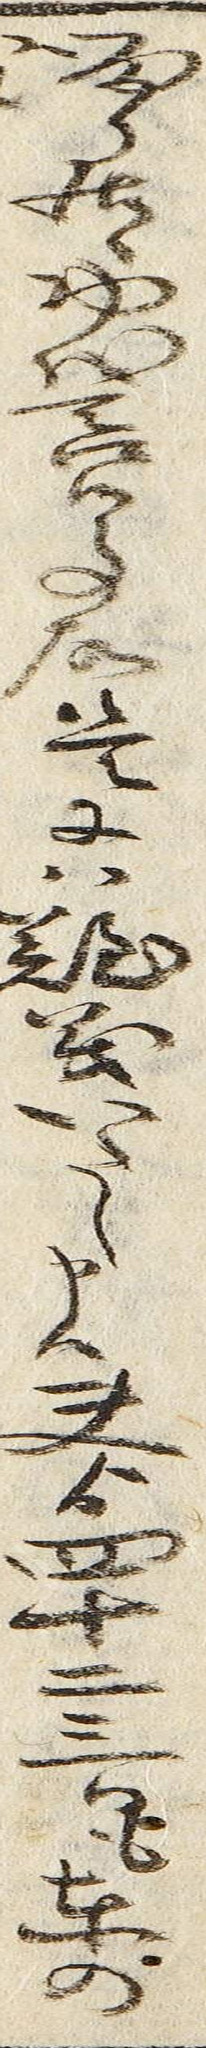溜り居候物を呑候事故是には難義いたし申候夫ゟ四十二三日も東の
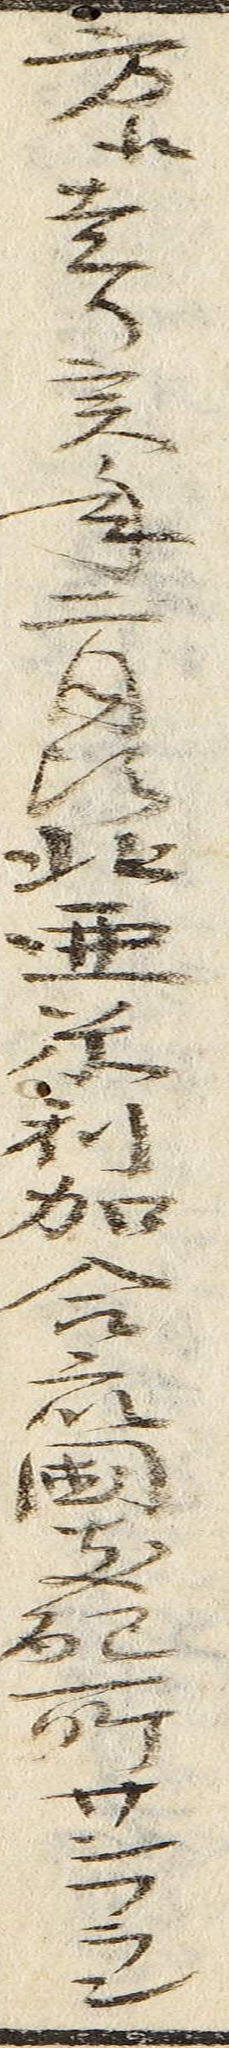方江走り亥年二月頃北亜米利加合衆国支配所サンフラン
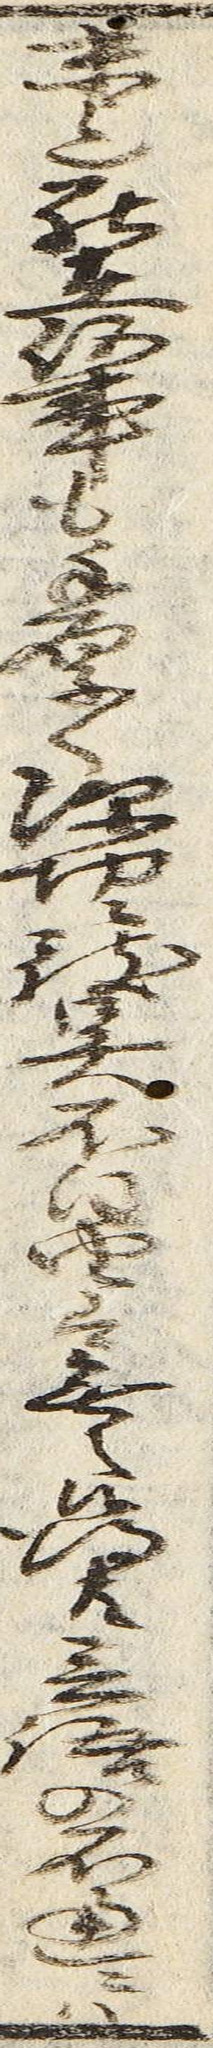末迄罷在何事も手厚く深切に致呉不自由は無之候得共言語の不通には
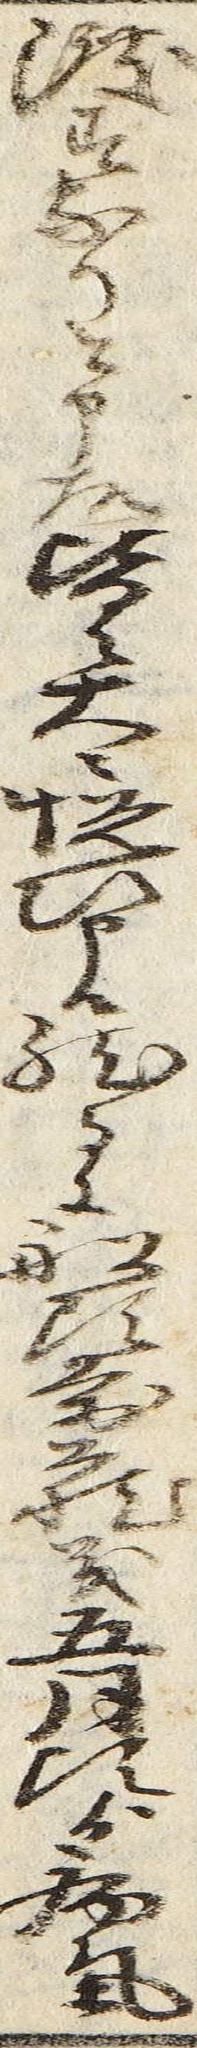渡すなりと申故皆々大に悦ひ申候然るに船頭万蔵義五月頃ゟ病気
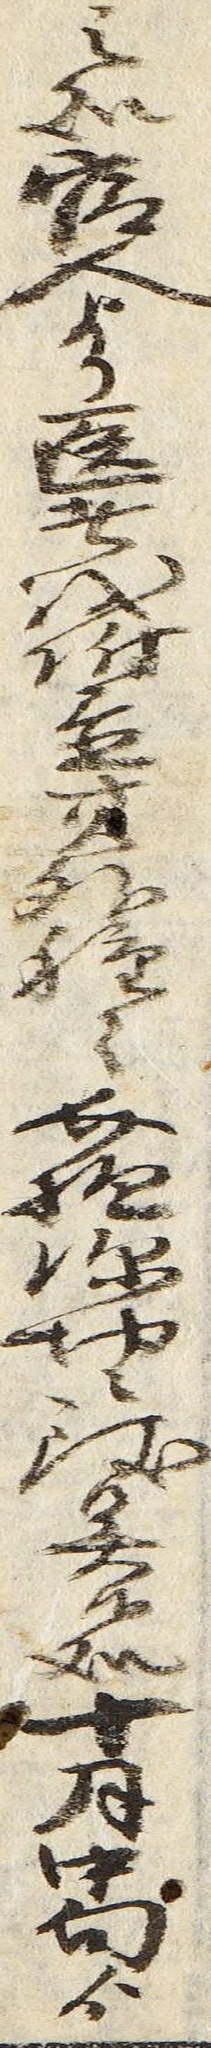之処官人より医者を附置其外種々介抱深切に致呉候処十月中旬ゟ
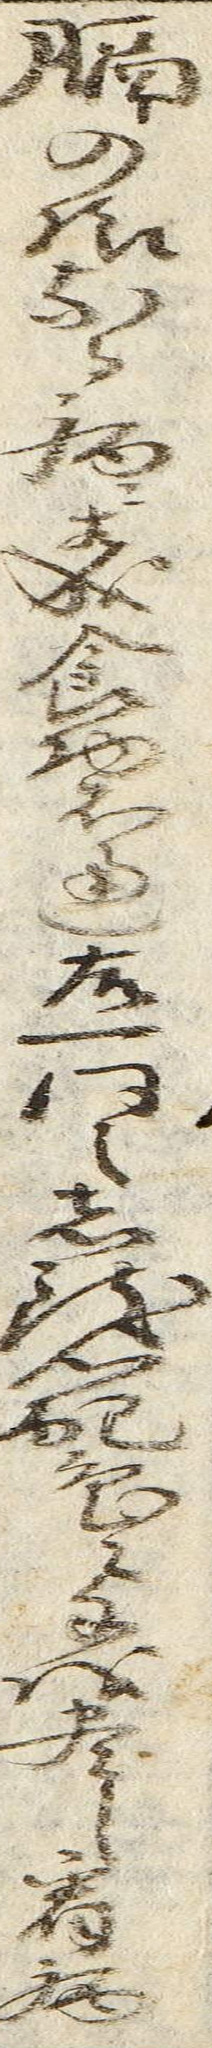膈の様なる病に相成食物不通故一同之者致心配色々手を尽し看病
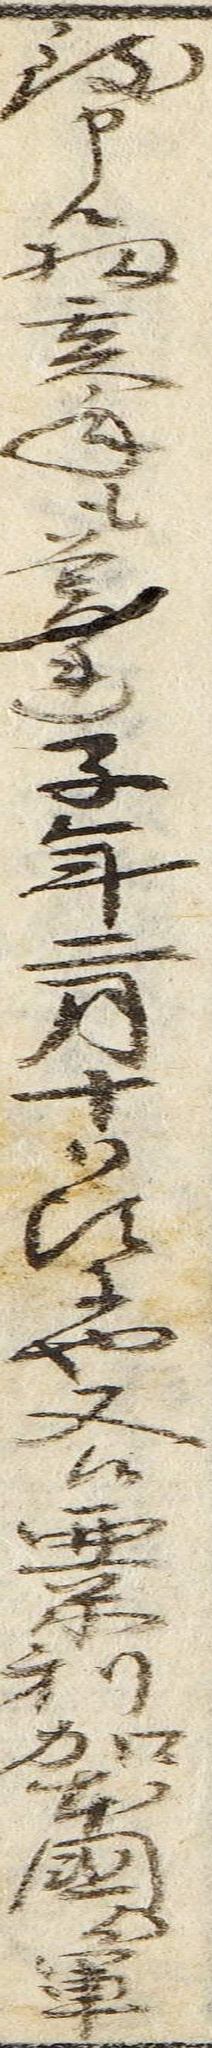致申候扨亥年も暮れ子年二月十日頃にや又候亜米利加本国ゟ軍

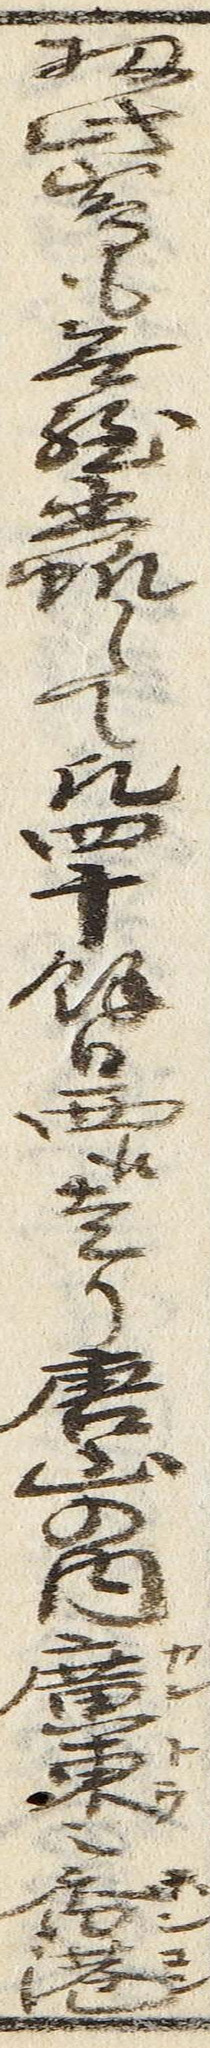扨此島も無程出帆して凡四十余日西江走り唐山の内広東之香港
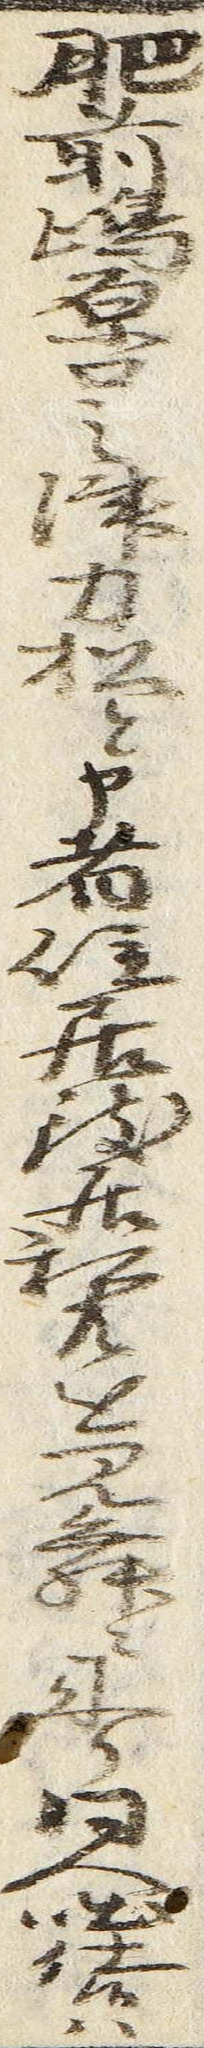肥前嶋原口之津力松と申者住居致居私共を見舞に来り同人咄仕候は
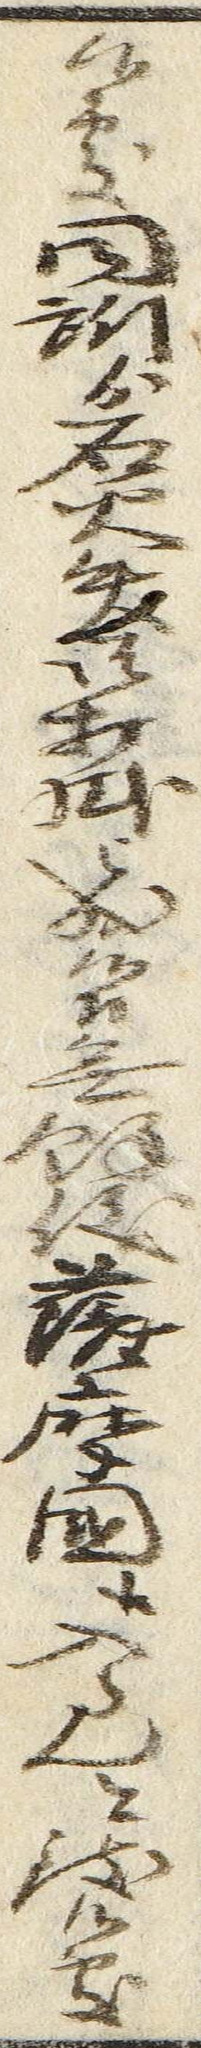候処同所ゟ石火矢御打掛被成候付無余儀薩摩国江入らんと致候処
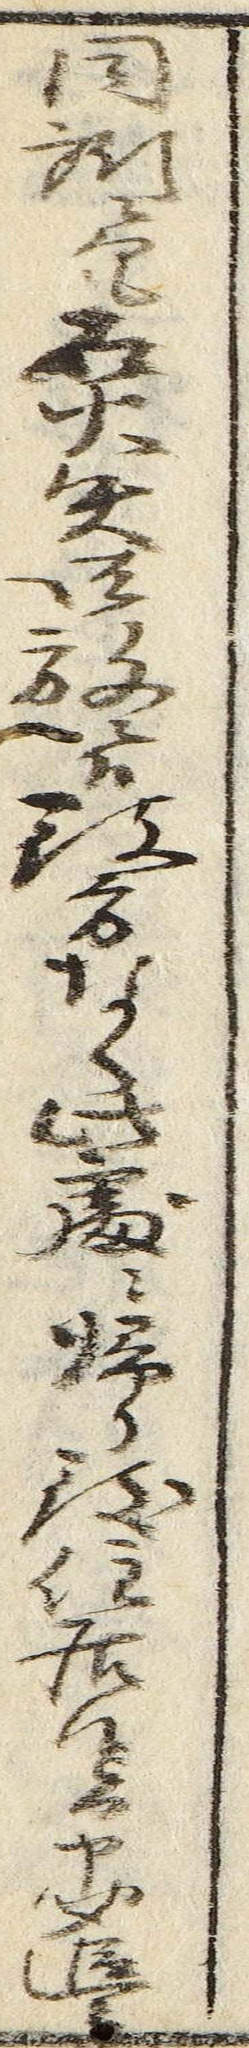同所に而も石火矢御放に付致方なく此処に帰り致住居候旨申聞追々

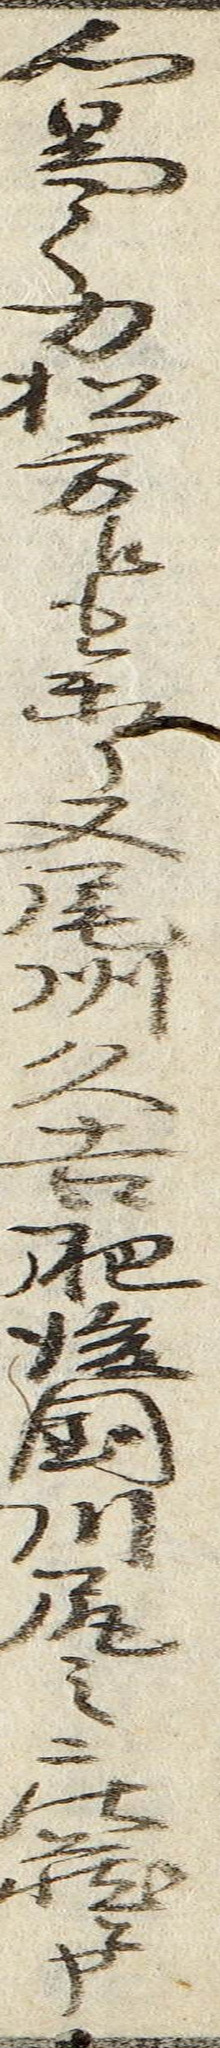心易く力松方江も参り又尾州久吉肥後国川尻之庄蔵と申
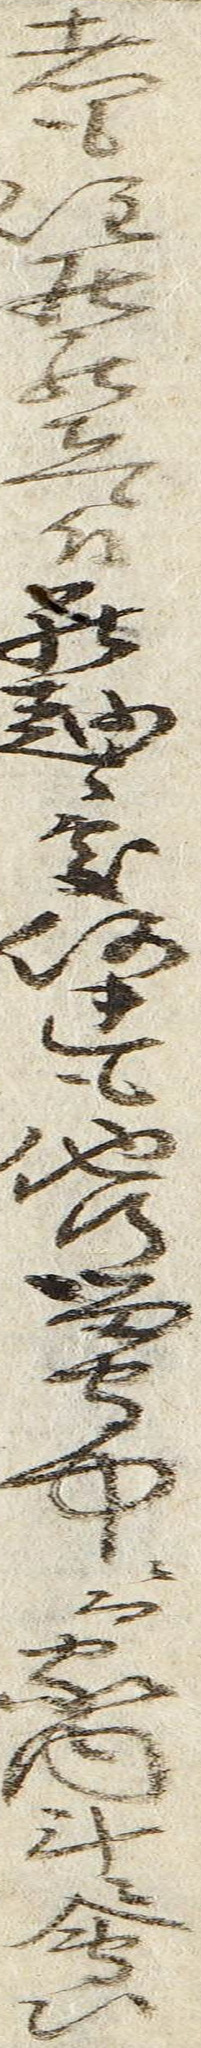者も住居罷在候付罷越候処何れも他行留守中に而家内計に会ひ
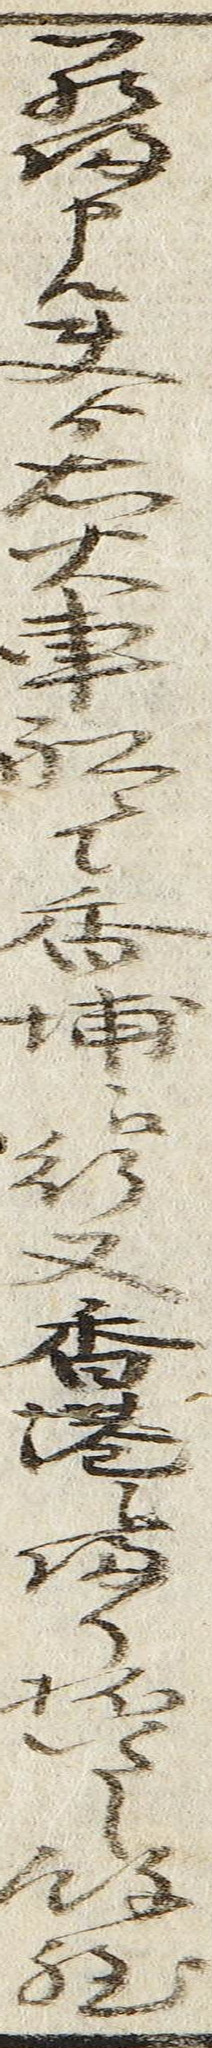罷帰申候夫ゟ右火車船にて香埔江行又香港江帰り抔いたし余程
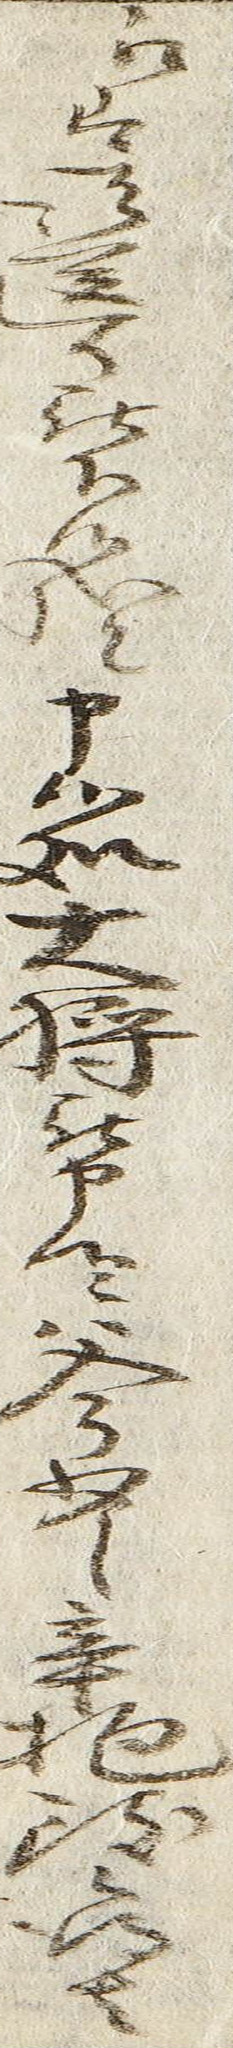江は御送り被下候哉と申候処大将被申候には今少し辛抱致候得者
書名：漂流夢物語
